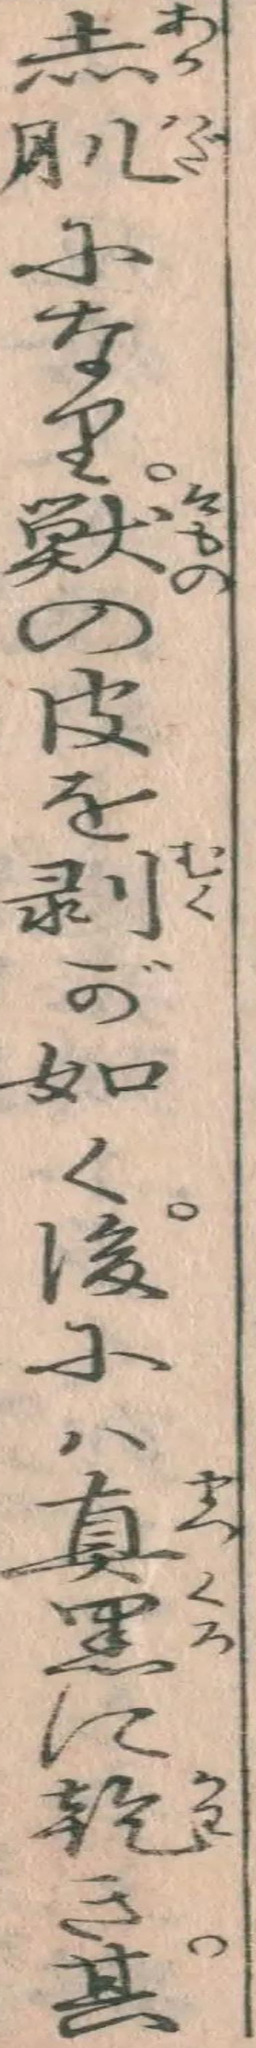赤肌になり。獣の皮を剥が如く。後には真黒に乾き。其
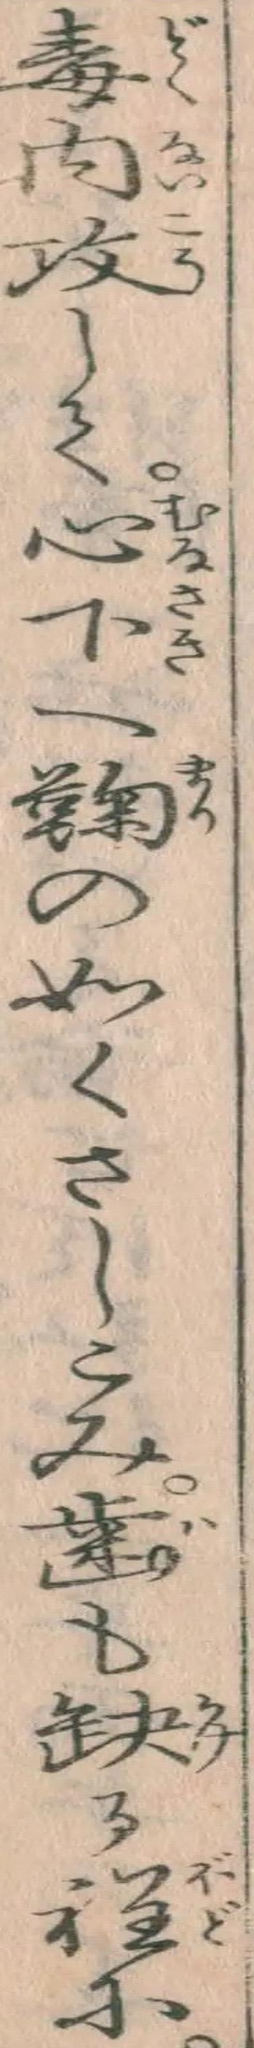毒内攻して。心下へ鞠の如くさしこみ。歯も缺る程に。
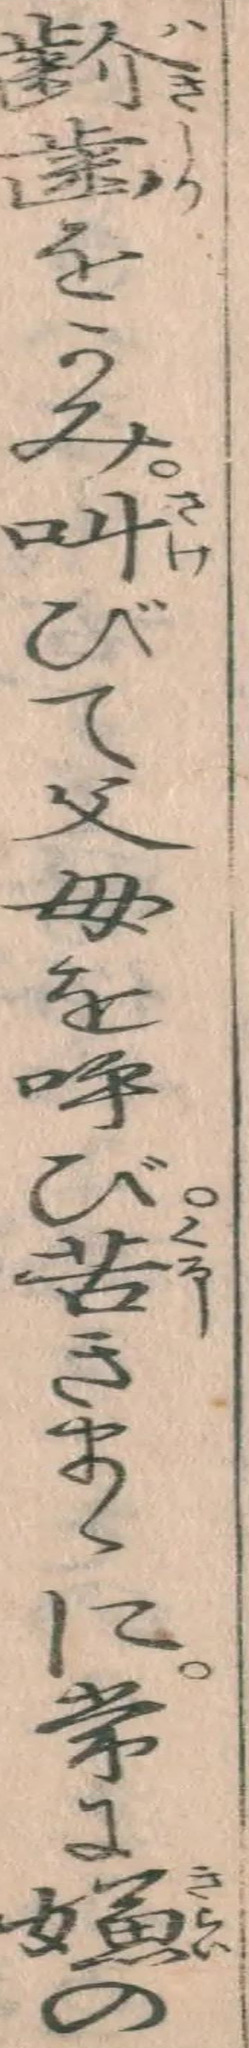齘歯をかみ。叫びて父母を呼び。苦きまゝに。常に嫌の
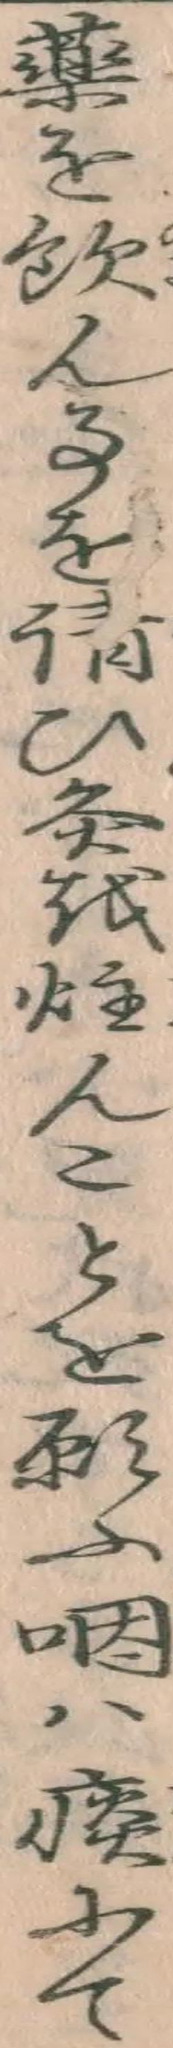薬を飲ん事を請ひ。灸を炷んことを願ふ。咽は痰にて
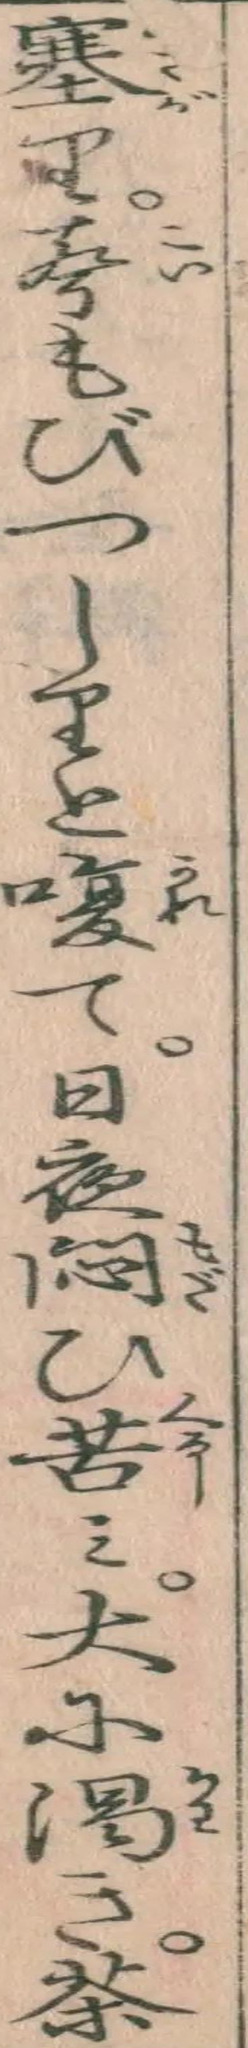塞り。声もびつしりと嗄て。日夜悶ひ苦み。大に渇き。茶
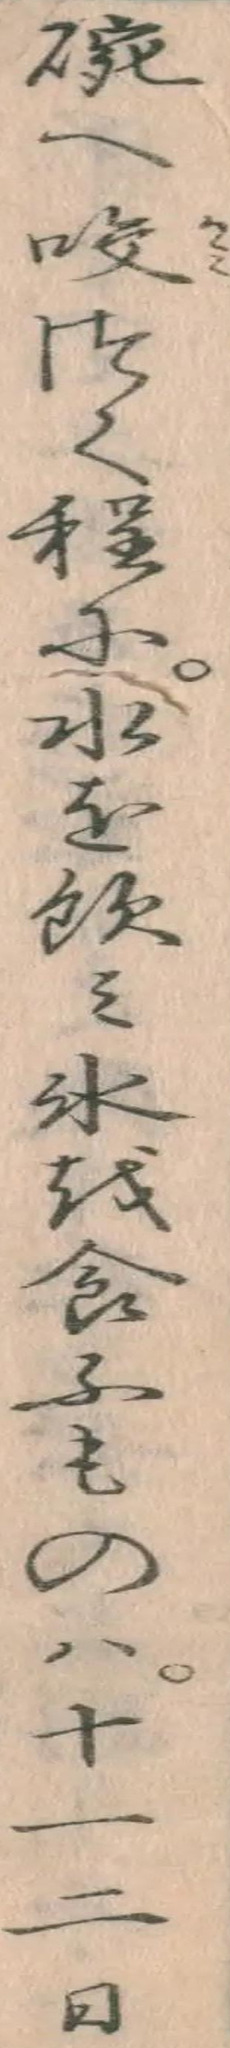碗へ咬つく程に。水を飲み氷を食ふものは。十一二日
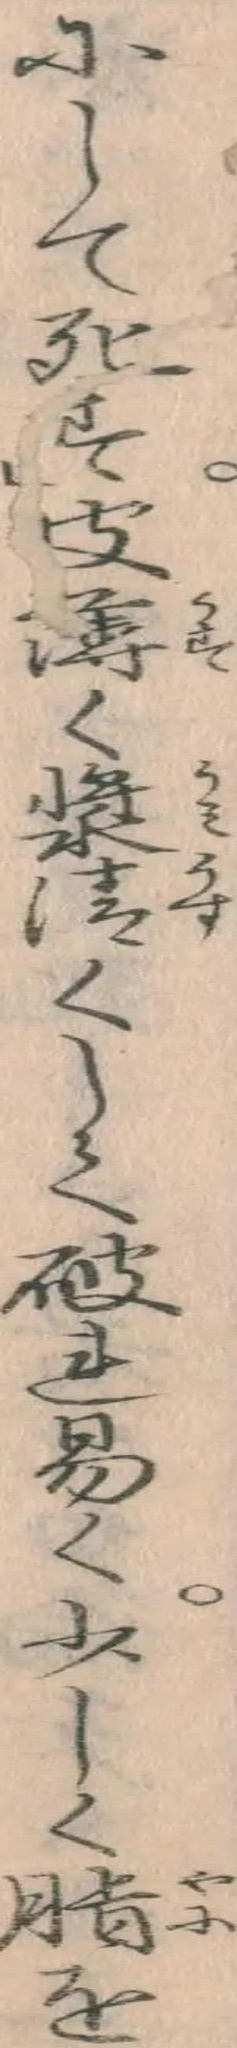にして死す。皮薄く漿薄くして破れ易く。少しく脂を
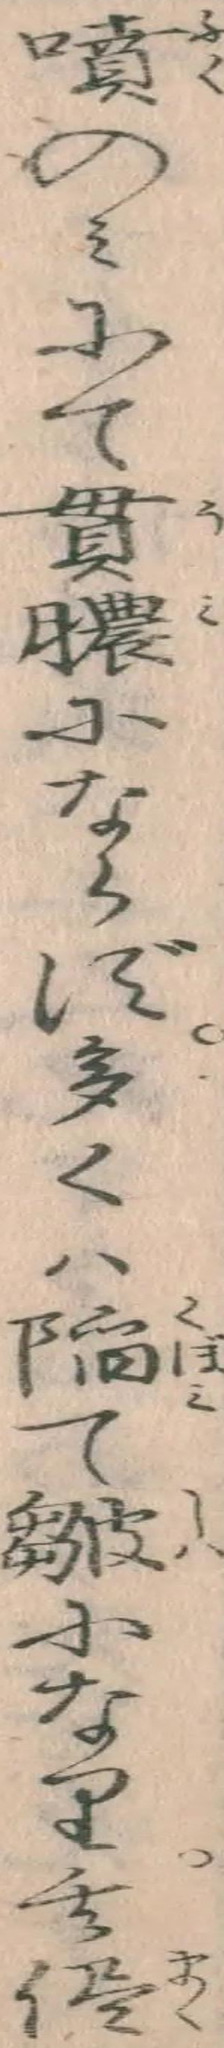噴のみにて貫膿にならず。多くは陥て皺になり。其侭
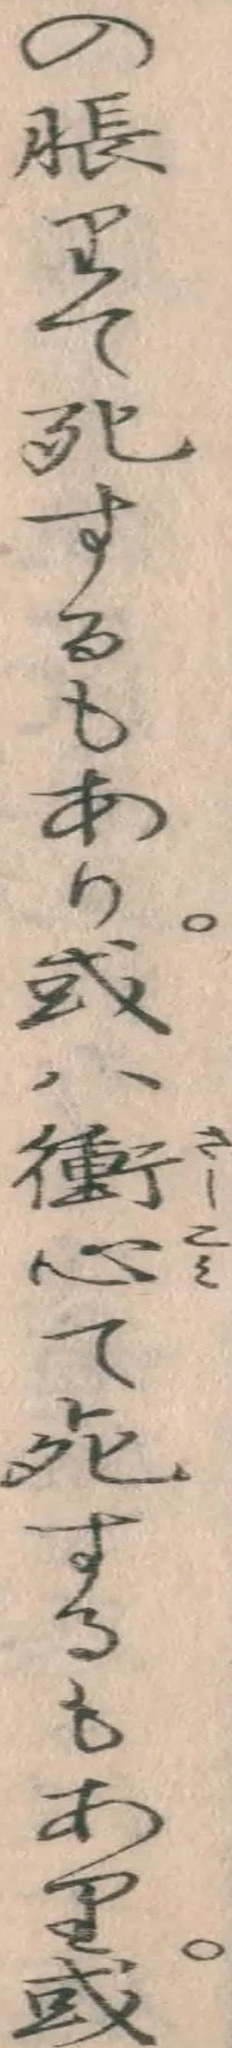の脹りて死するもあり。或は衝心て死するもあり。或
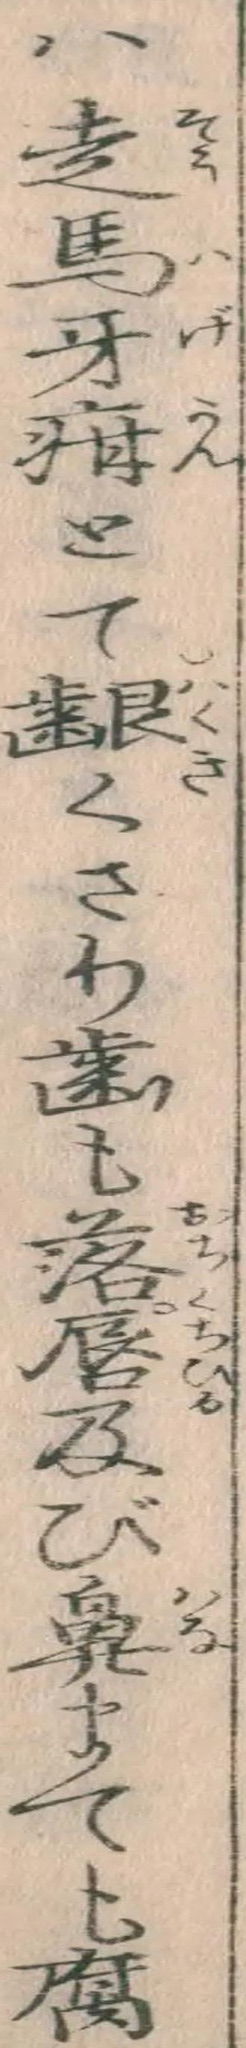は走馬牙疳とて。齦くさり歯も落。唇及び鼻にても腐
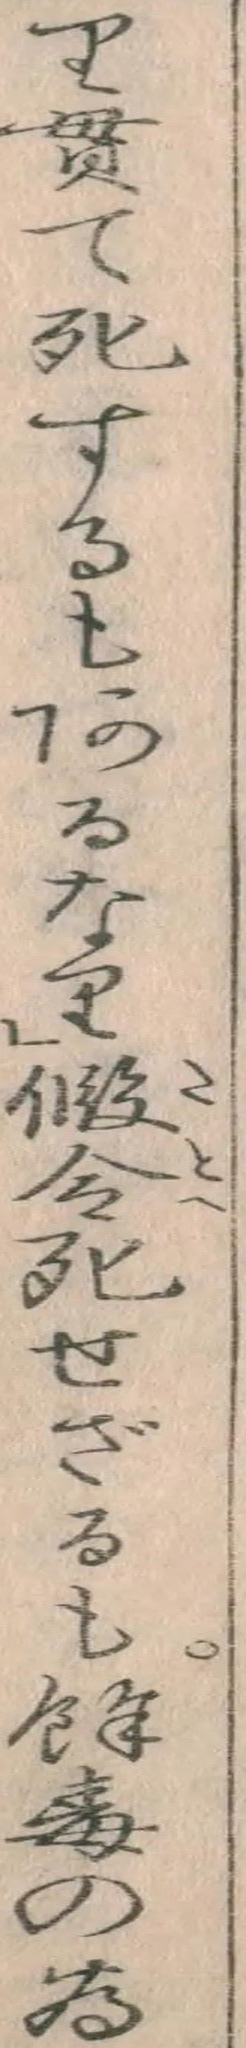り貫て死するもあるなり」仮令死せざるも。余毒の為
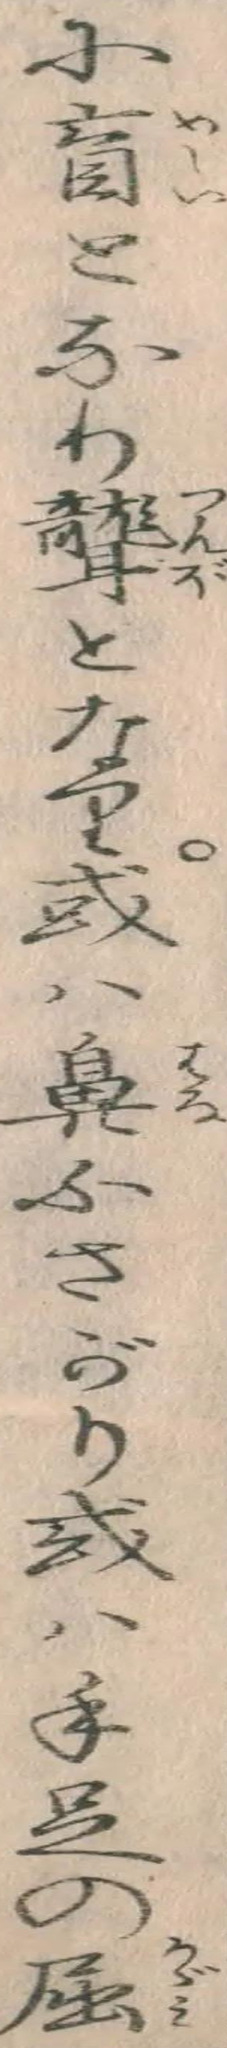に盲となり聾となり。或は鼻ふさがり或は手足の屈
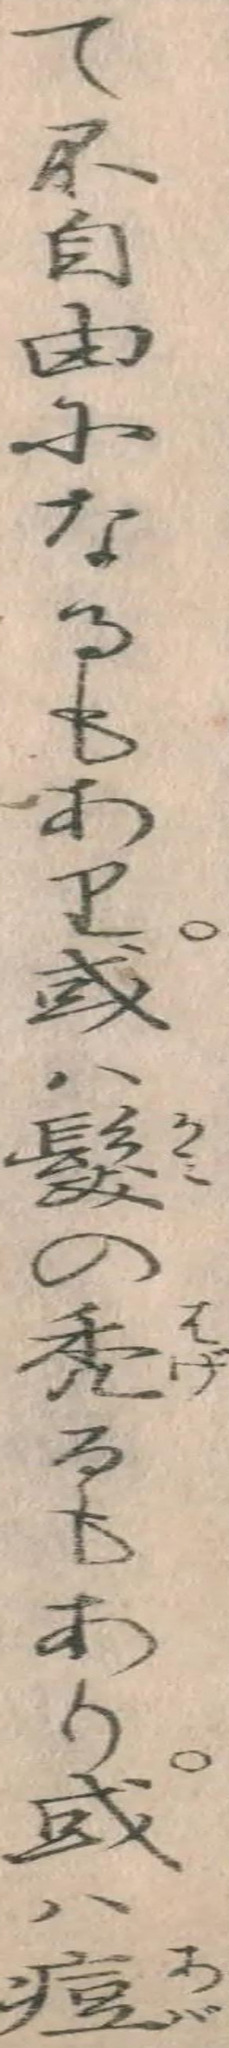て不自由になるもあり。或は髪の禿るもあり。或は痘
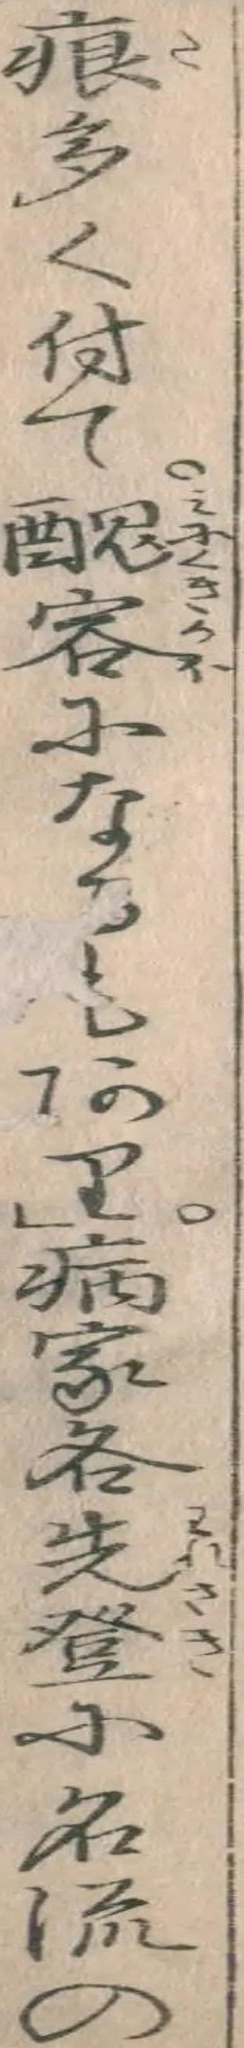痕多く付て。醜容になるもあり。」病家各先登に名流の

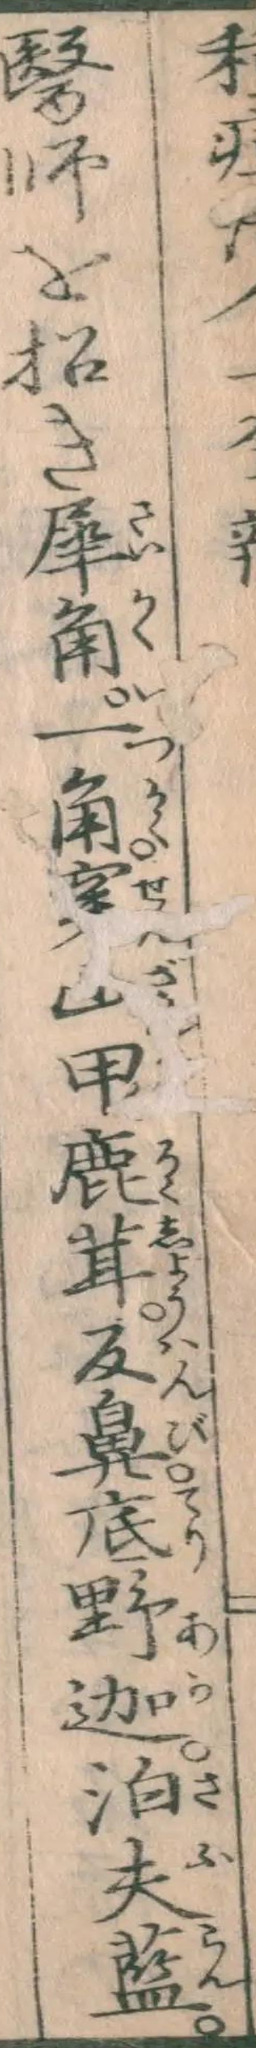医師を招き犀角。一角。穿山甲鹿茸。反鼻。底野迦。泊夫藍。
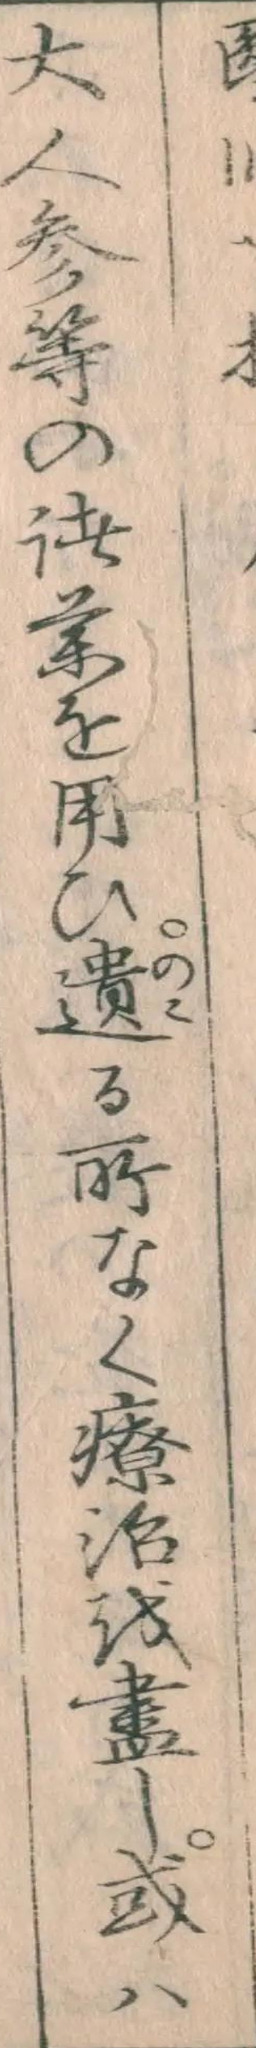大人参等の諸薬を用ひ。遺る所なく療治を尽し。或は
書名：種痘活人十全辯
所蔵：国立国会図書館 National Diet Library, JAPAN
